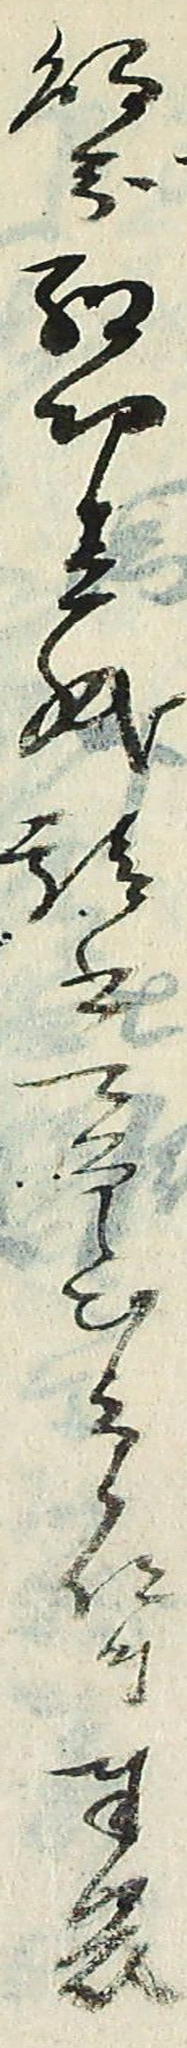触知組切壱紙請書可差出旨被仰付奉畏
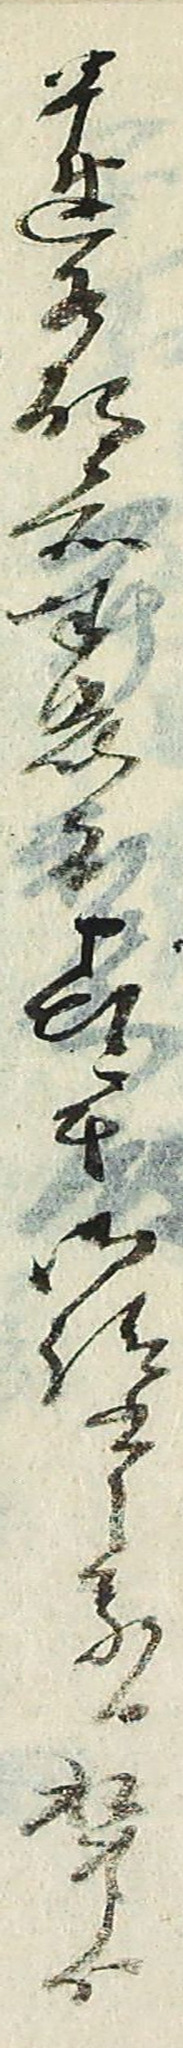早速相触候所奉畏旨申出候に付御請書之義は私共ゟ
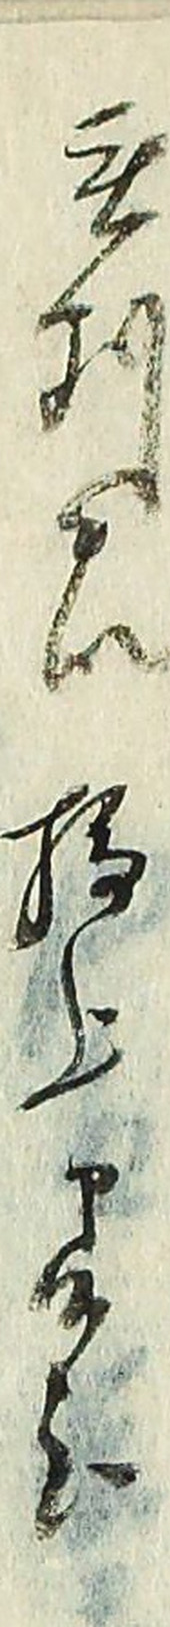連判を以指上申候以上
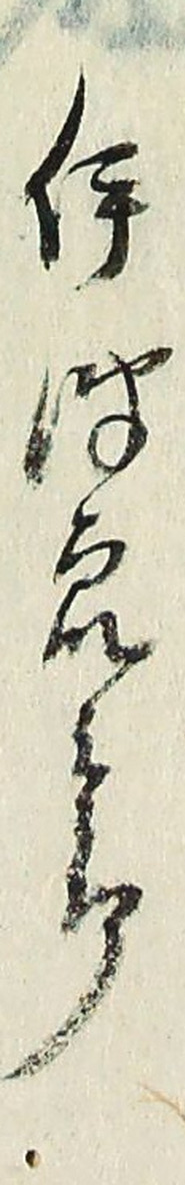伊澤虎三郎
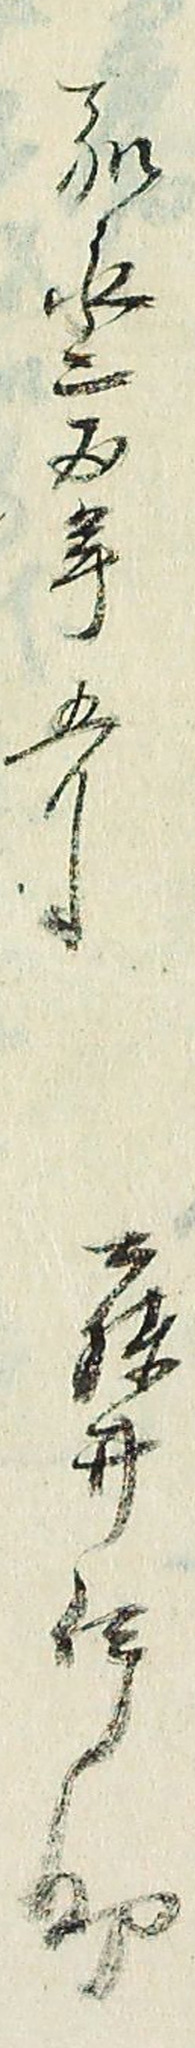嘉永二酉年五月藤井伊助
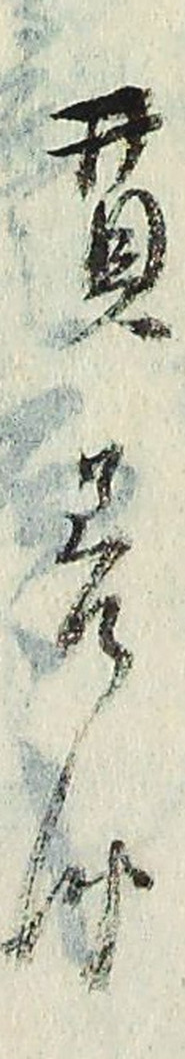井貝善助
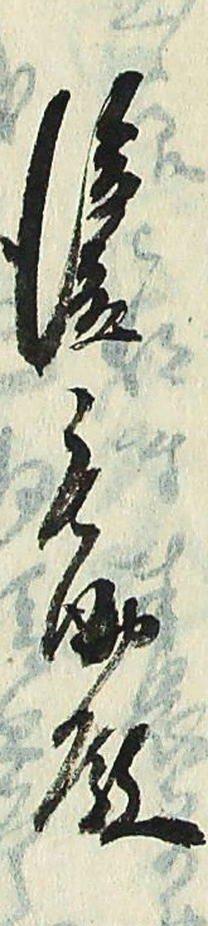後藤庄助殿
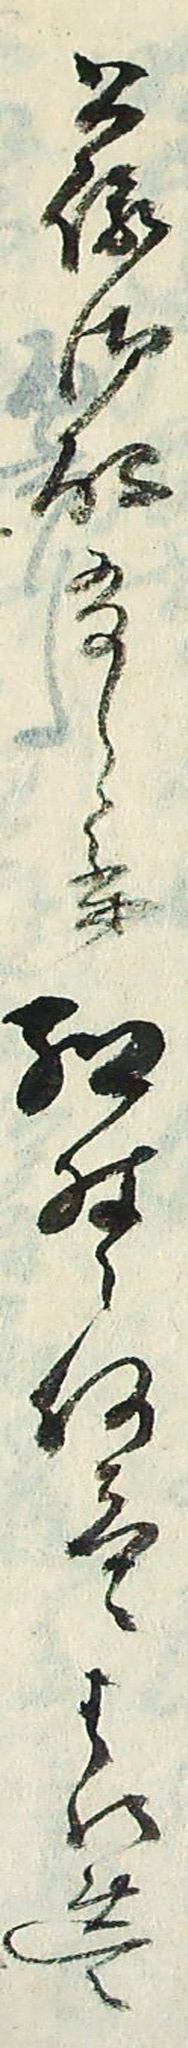公儀御触有之候条組村々何者によらす逸々
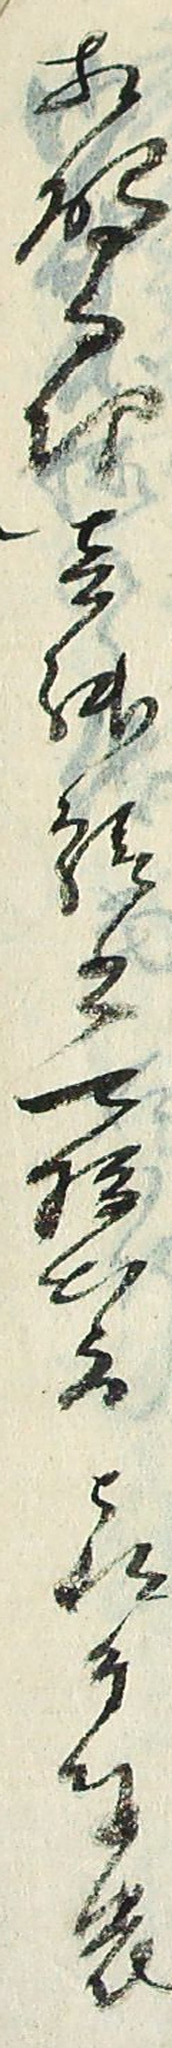相触与切壱紙請書可指出旨被仰付奉畏

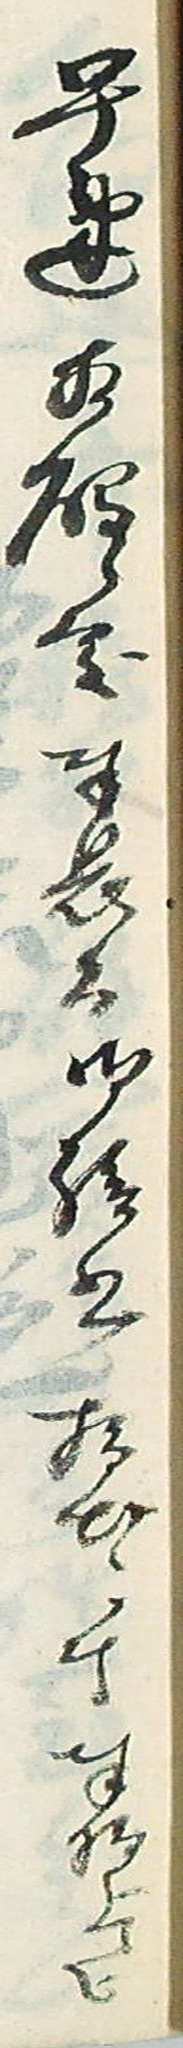早速相触候処奉畏旨御請書指出候に付奉指上候以上
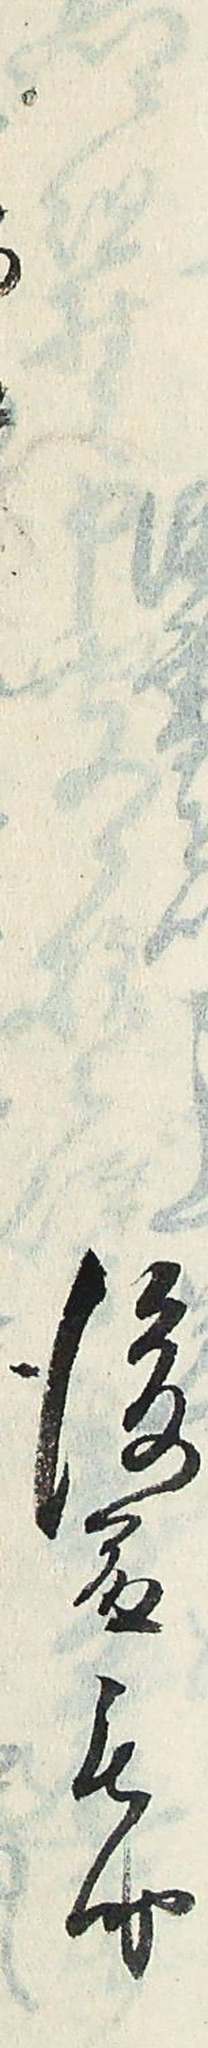後藤庄助
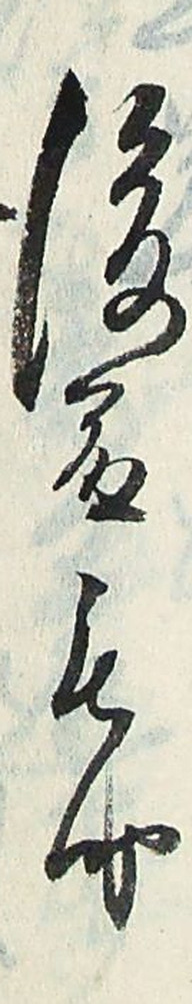後藤庄助
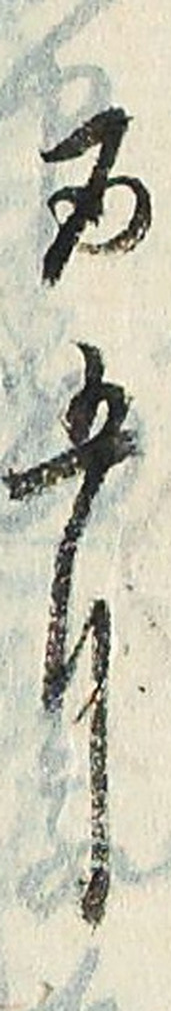酉五月
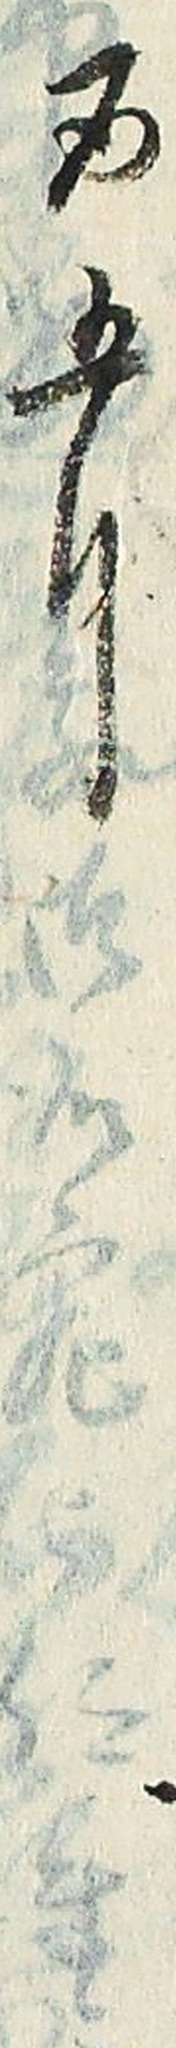酉五月
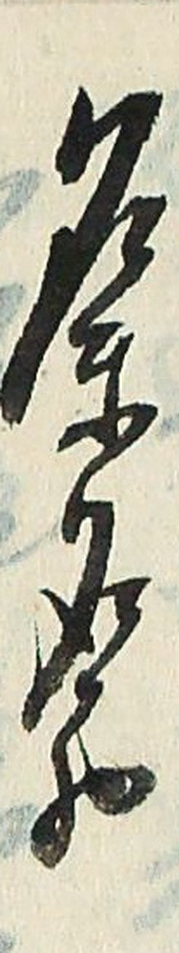名東名西
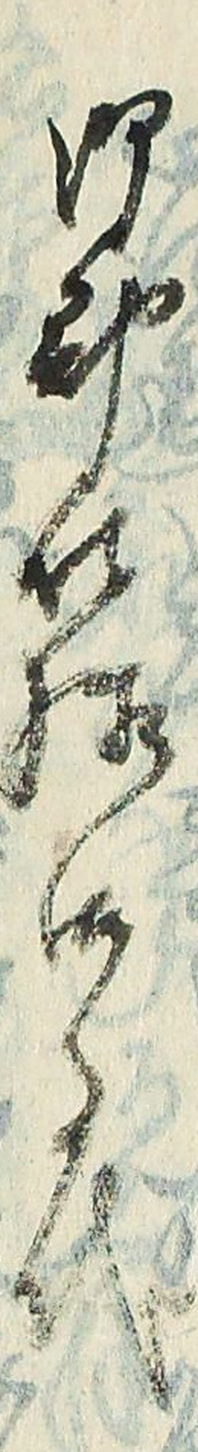御郡代様御手代
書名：諸御用御□受書控
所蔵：鳴門教育大学 Naruto University of Education
